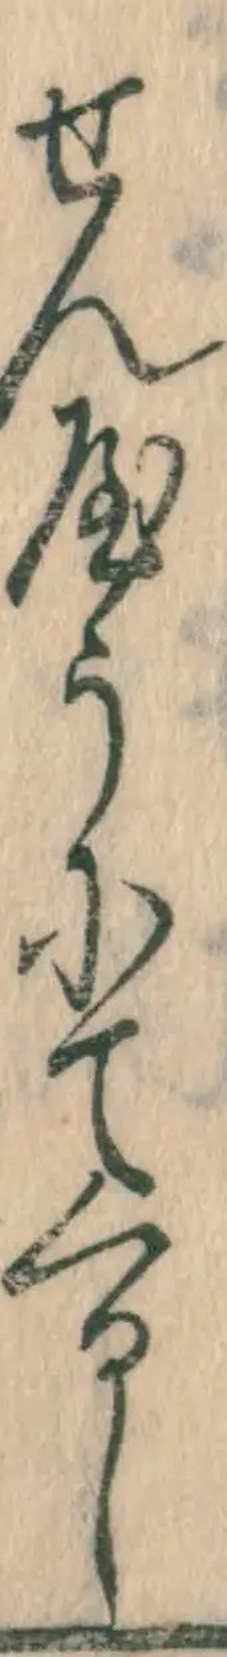せんやうにてくるし
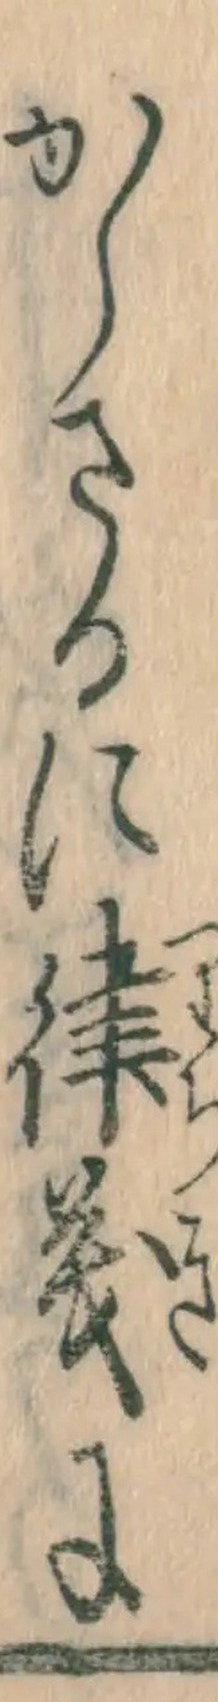からさるに律義に

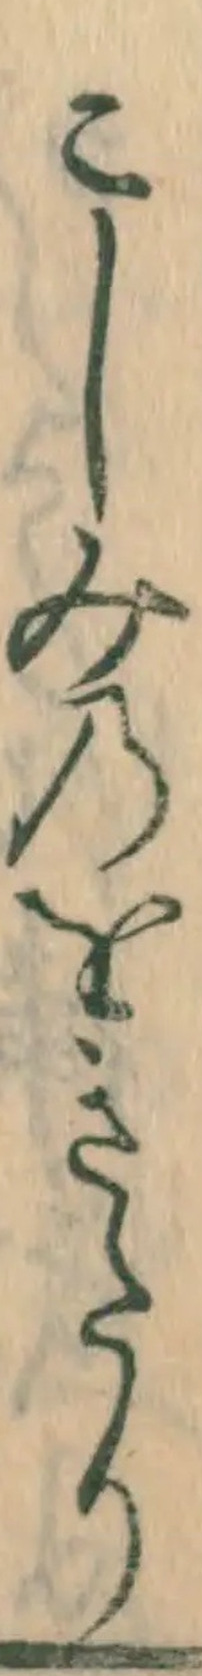こしみのをきたり
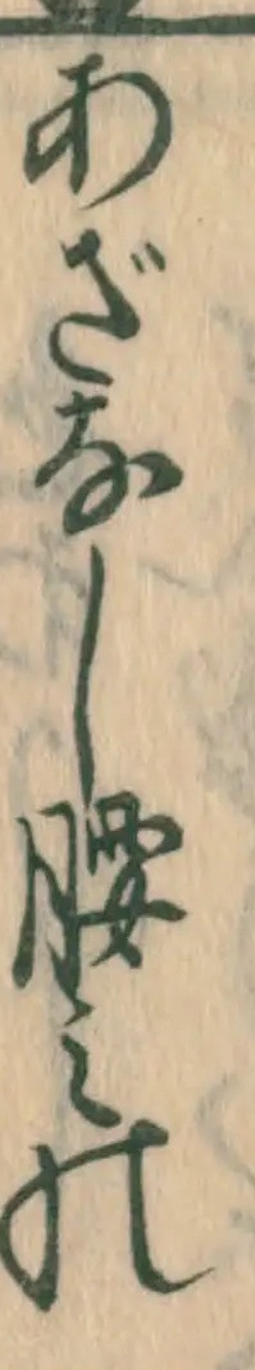●あざなし腰みの
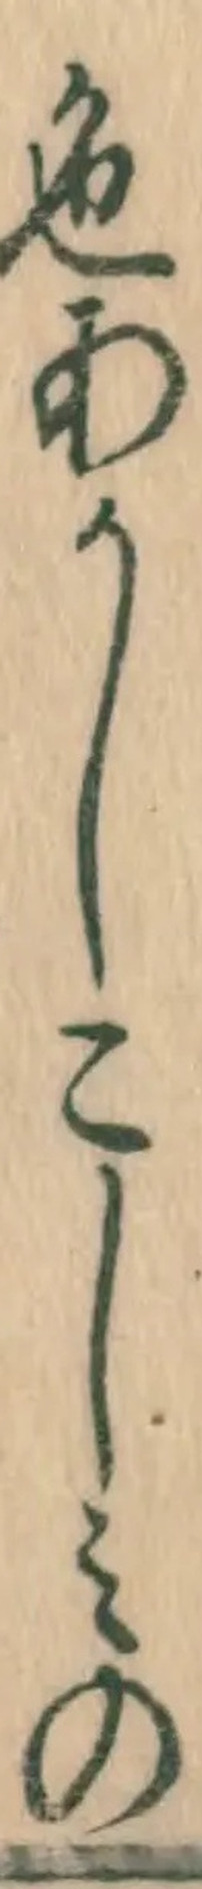色あかしこしみの
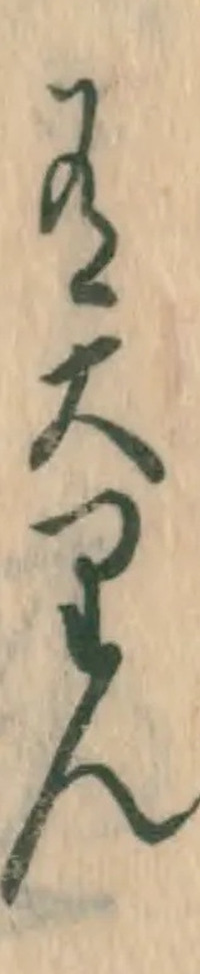有大りん
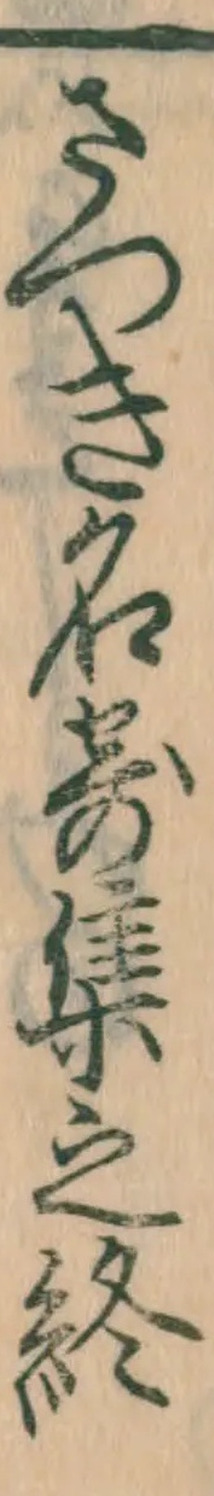さつき名寄集之終
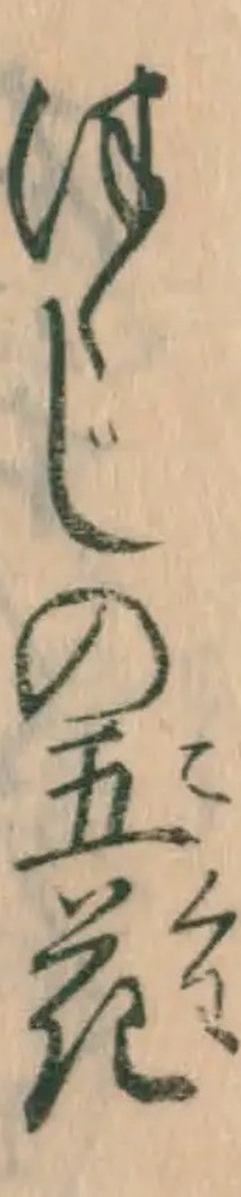つゝじの五花
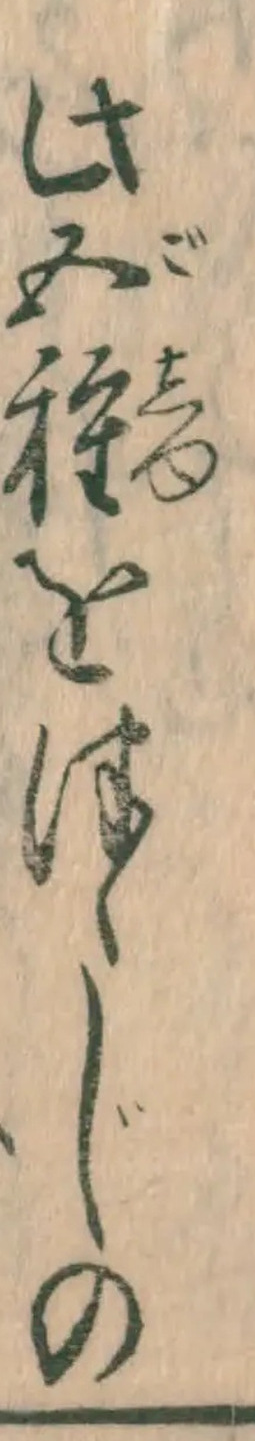此五種をつゝじの
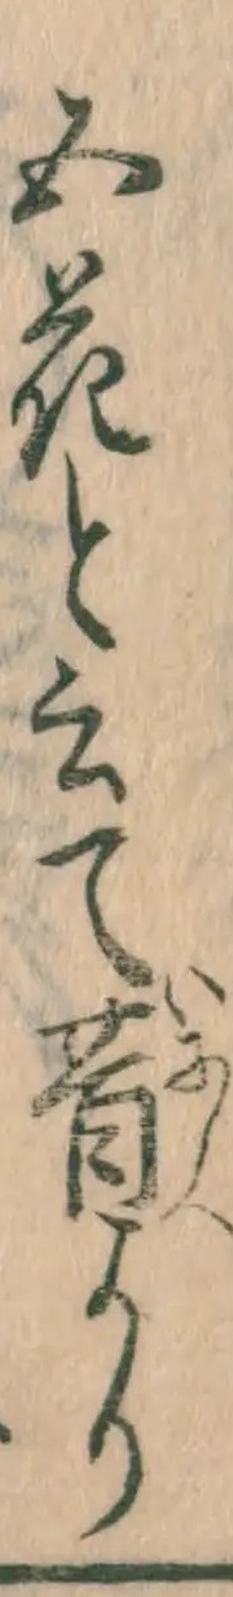五花と云て昔より
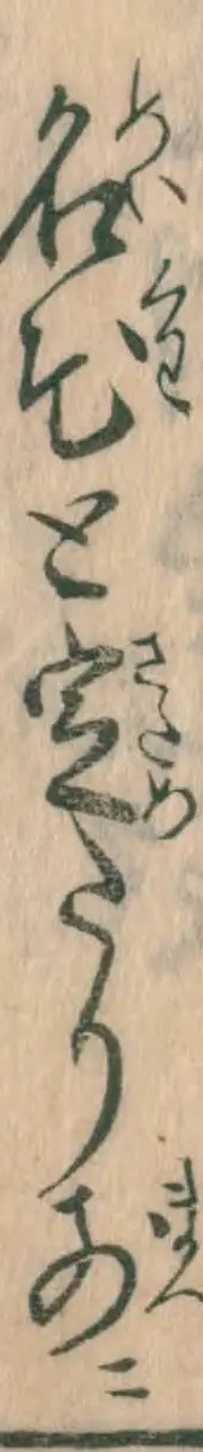名花と定たり前
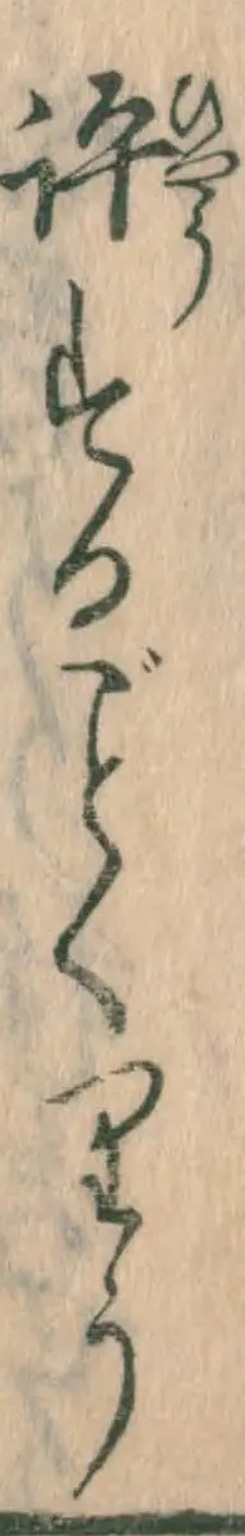評するごとくりう
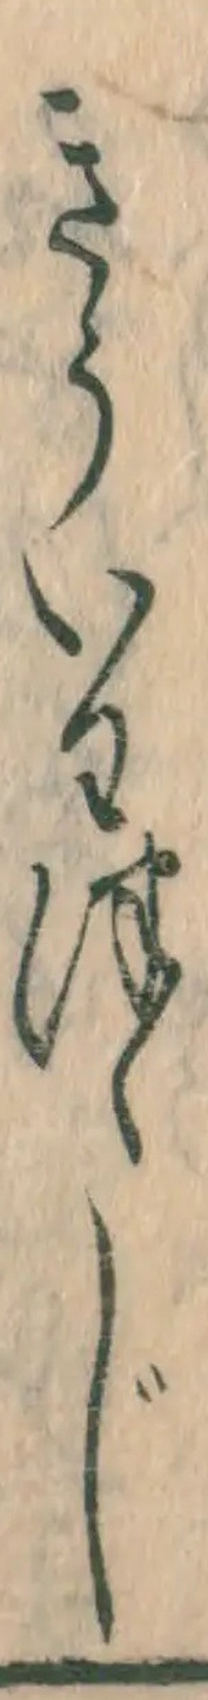きういわつゝじ
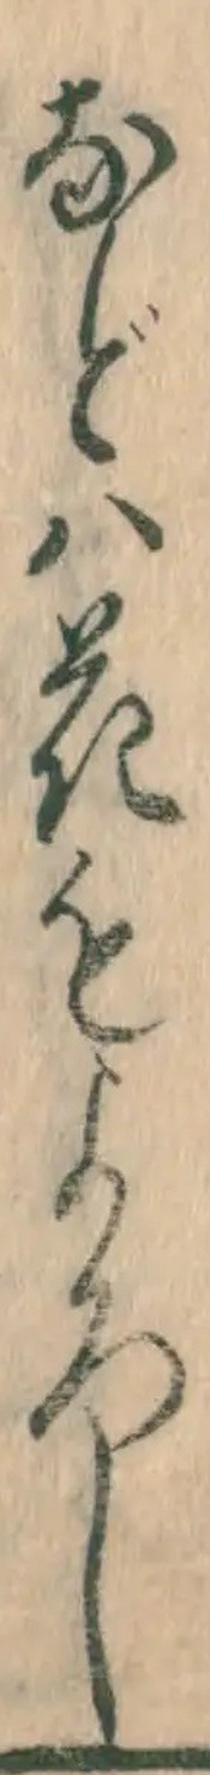などは花もよろし

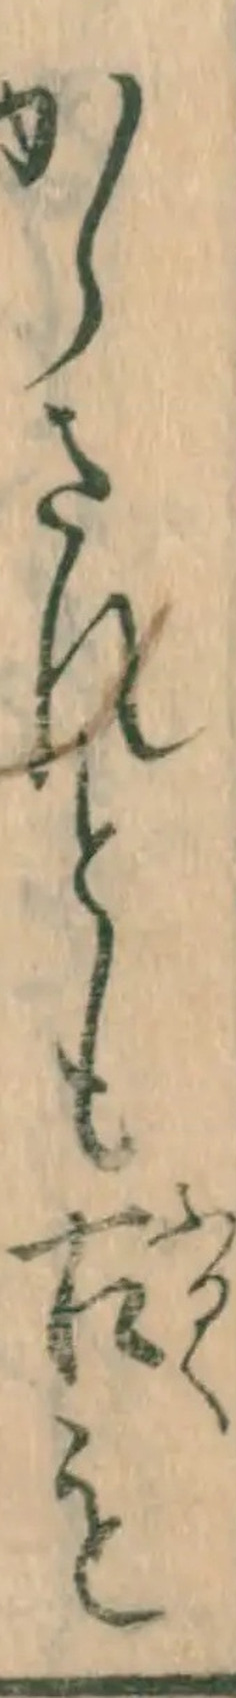からされとも古も
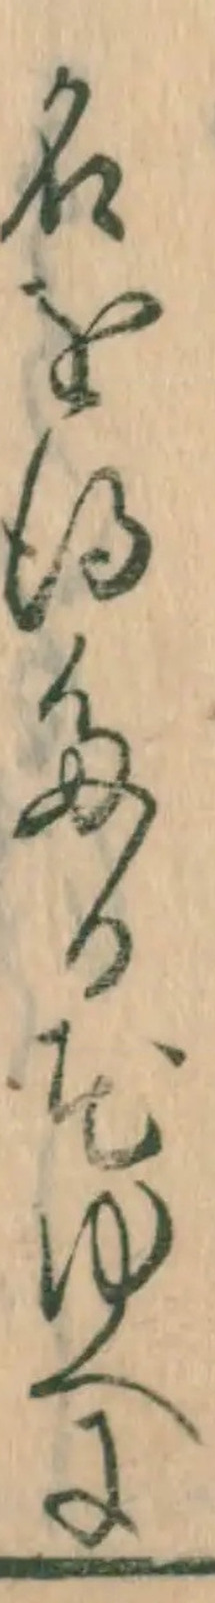名を得たる花ゆへに
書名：錦繍枕 5巻. [5]
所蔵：国立国会図書館 National Diet Library, JAPAN
